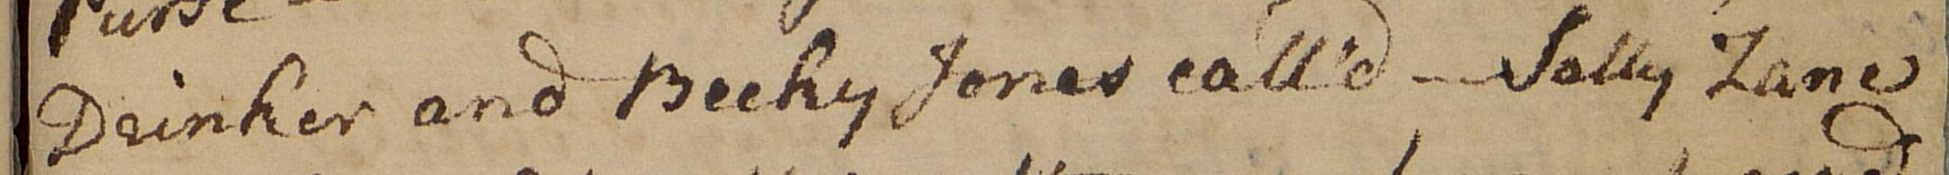Drinker and Becky Jones call'd- Sally Zane
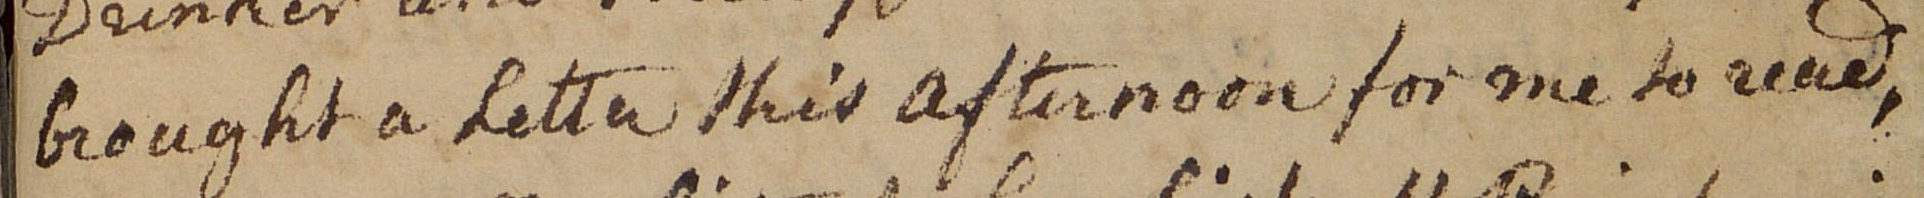brought a Letter this Afternoon for me to read,
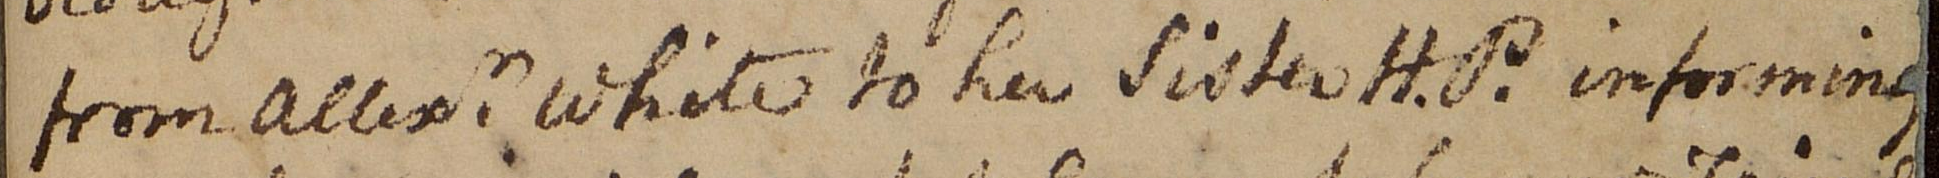from Allex^r. White to her Sister H.P. informing
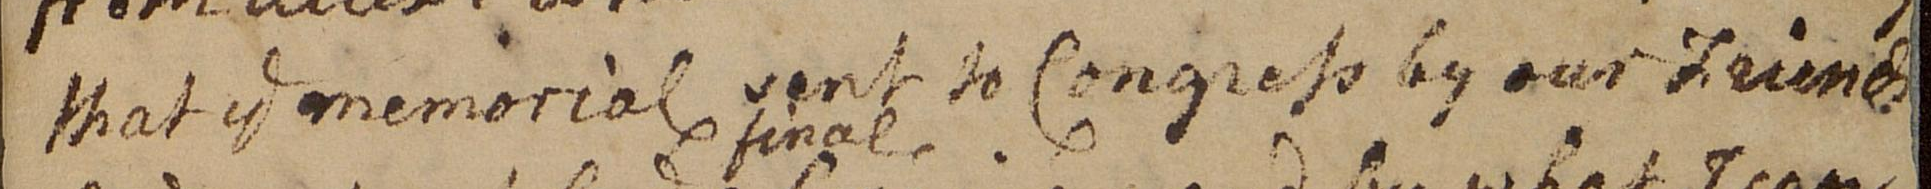that y^e memorial sent to Congress by our Friend
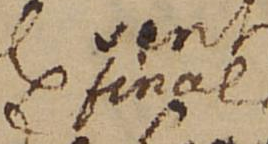final
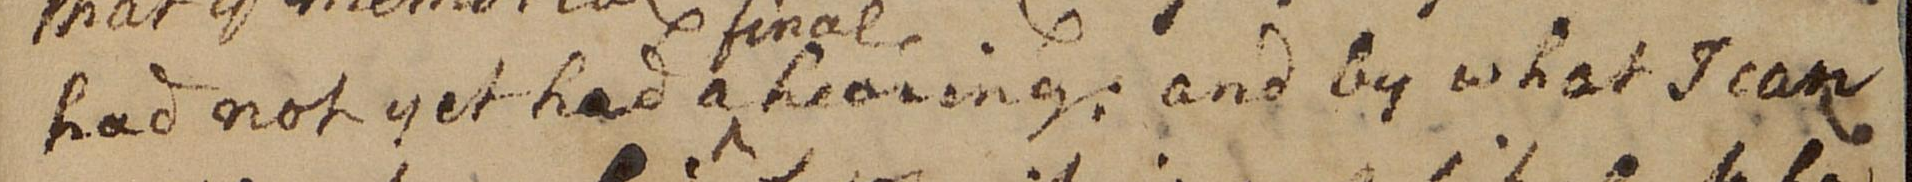had not yet had a ^ hearing; and by what I can
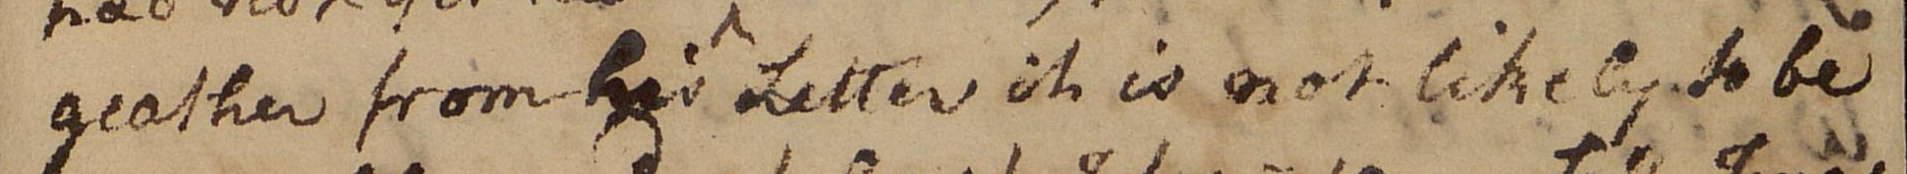geather from his Letter it is not likely to be
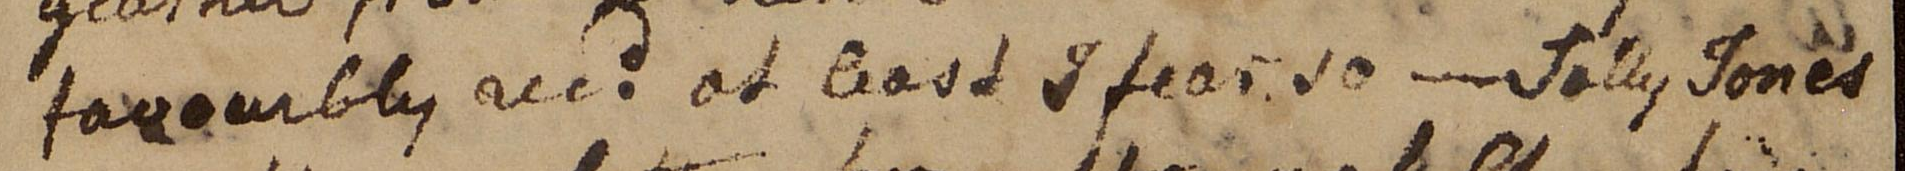favourbly rec^d. at least I fear so- Sally Jones
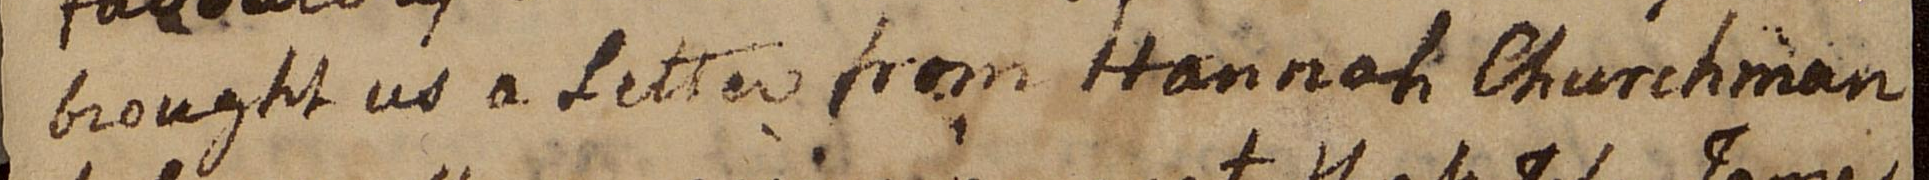brought us a Letter from Hannah Churchman
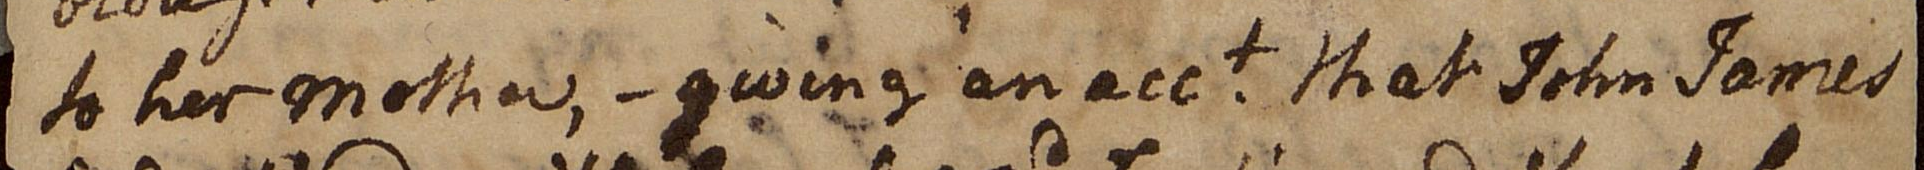to her mother,- owing an acc^t. that John James
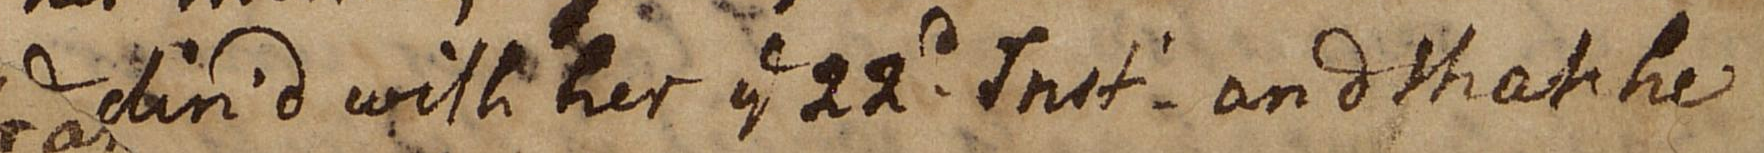din'd with her y^e 22^d. Inst'- and that he
